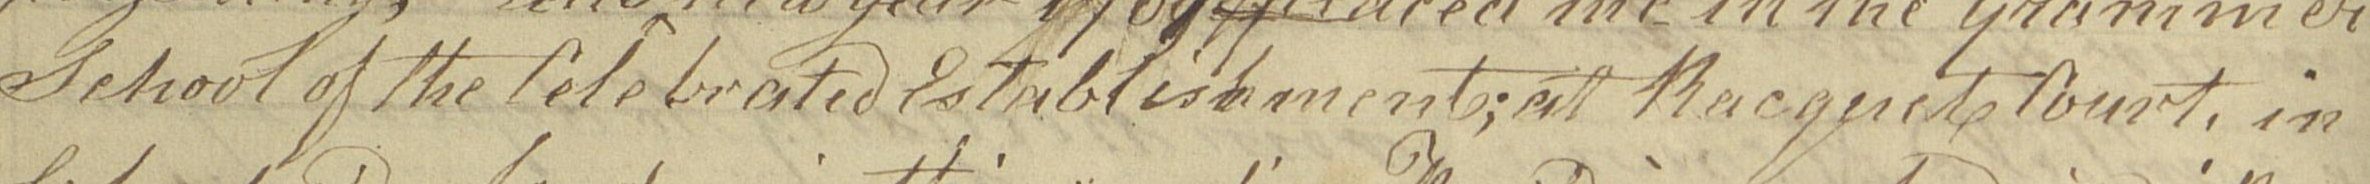School of the Celebrated Establishments; at Racquets Court, in
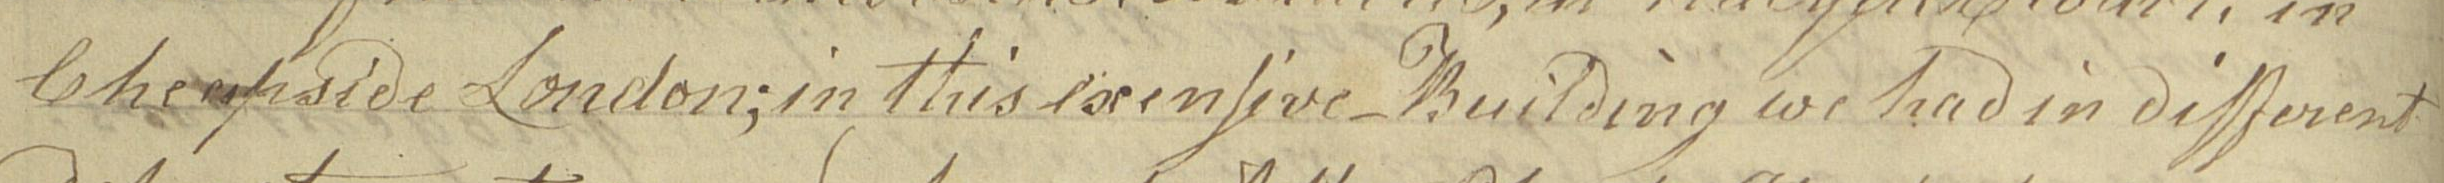Cheapside London; in this exensive Building we had in different
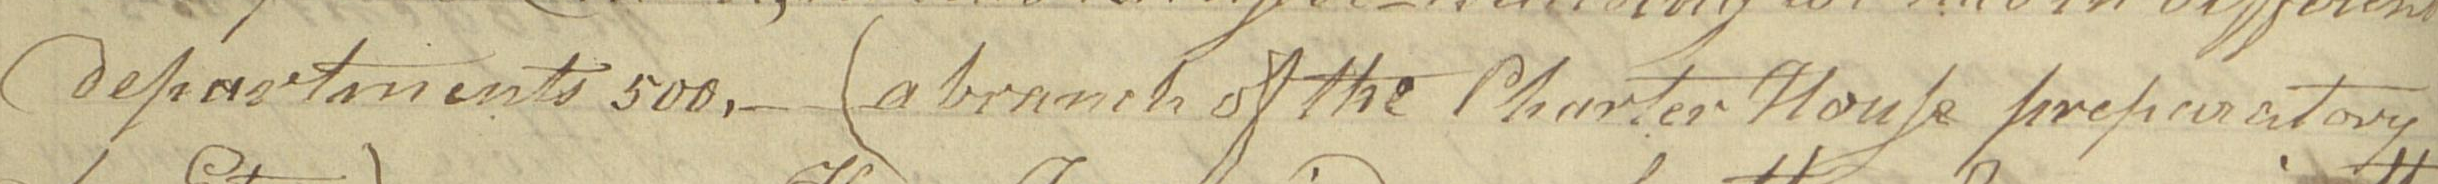departments 500, (a branch of the Charter House preparatory
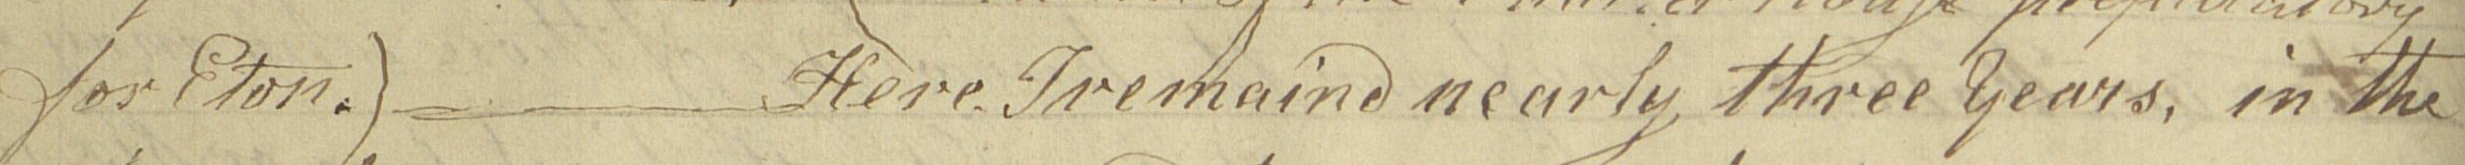for Eton.) Here I remaind nearly three Years, in the
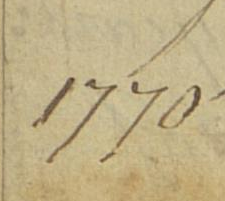1770
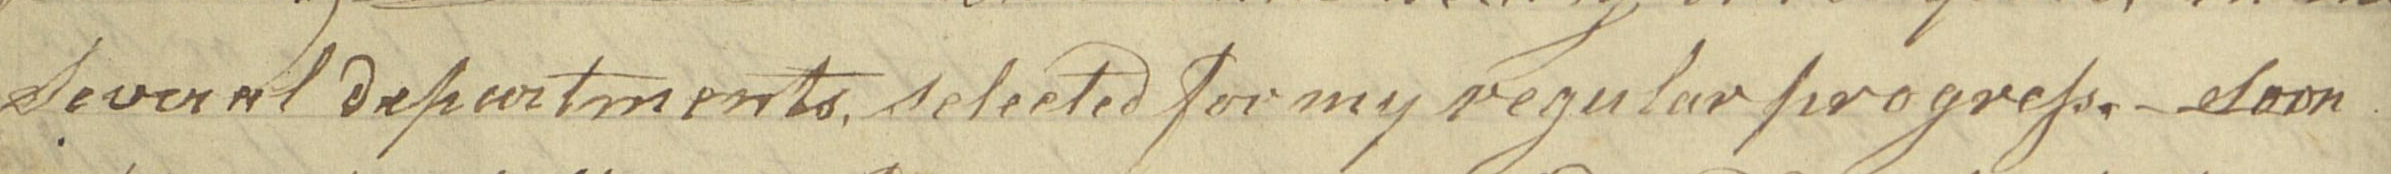several departments selected for my regular progress. Soon
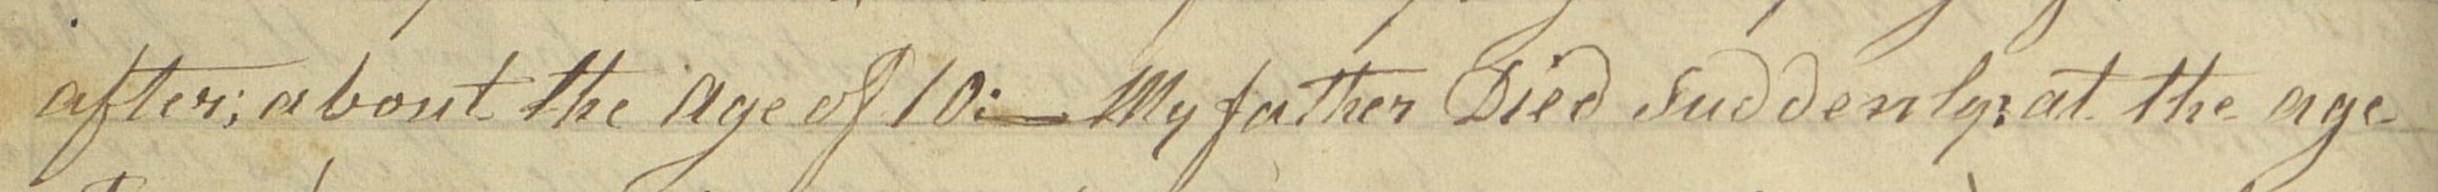after; about the age of 10: My father Died Suddenly: at the age
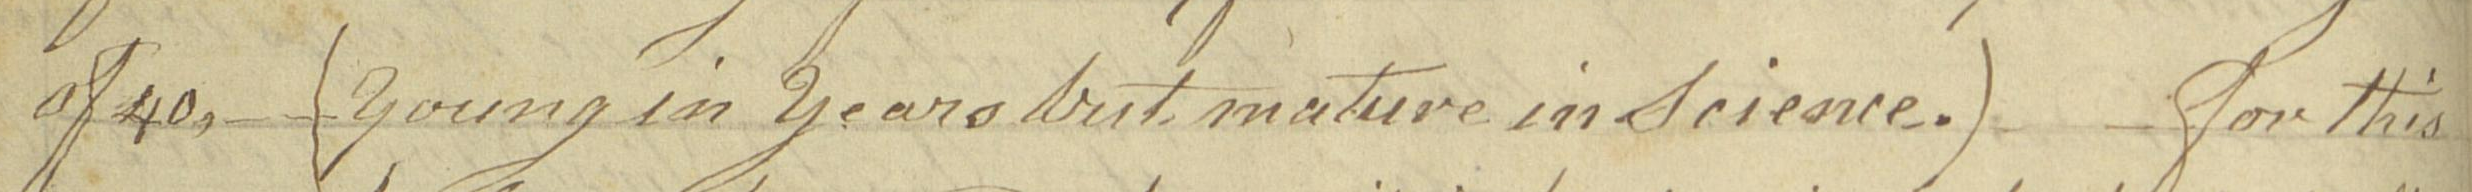of 40, (young in Years but mature in Science.) for this
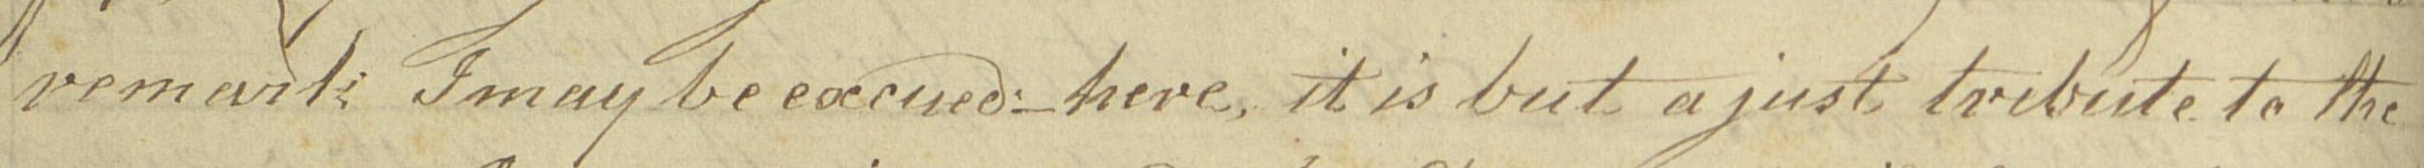remark I may be excused: here, it is but a just tribute to the
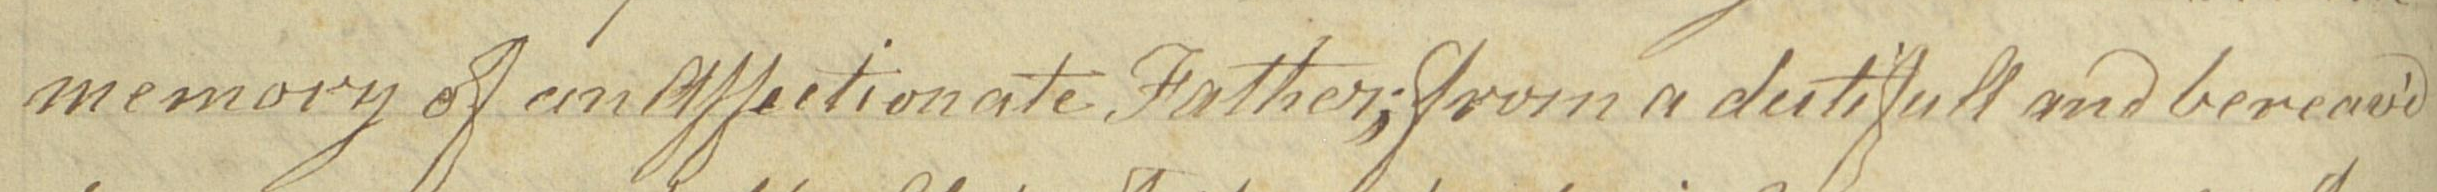memory of an Affectionate Father; from a dutifull and bereav'd
